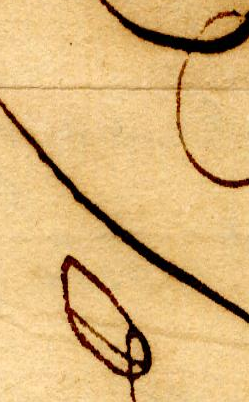To
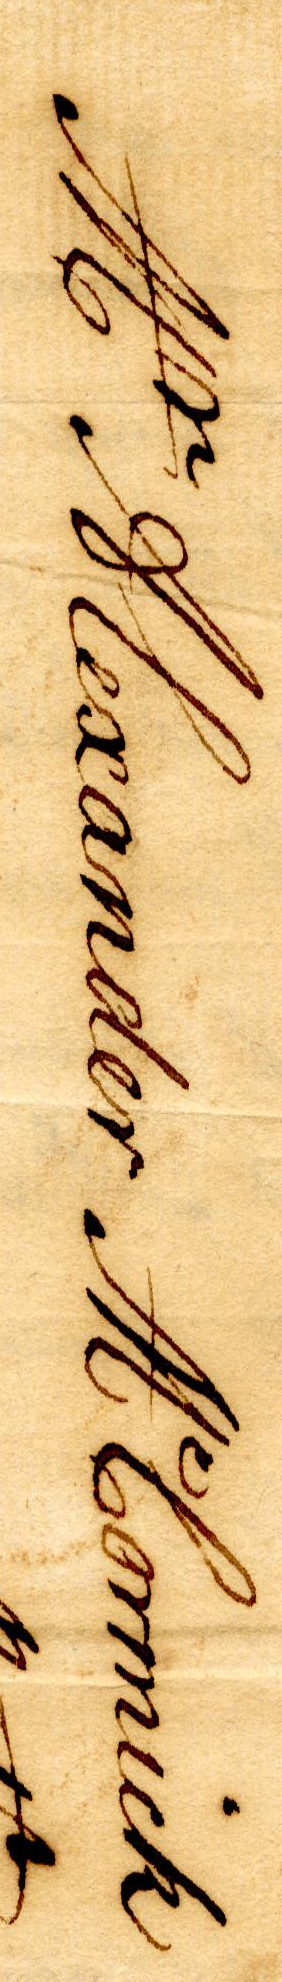M^r Alexander M^cCormick
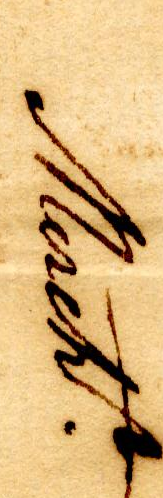Mercht.
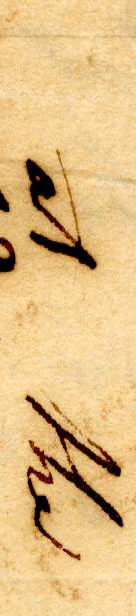at the
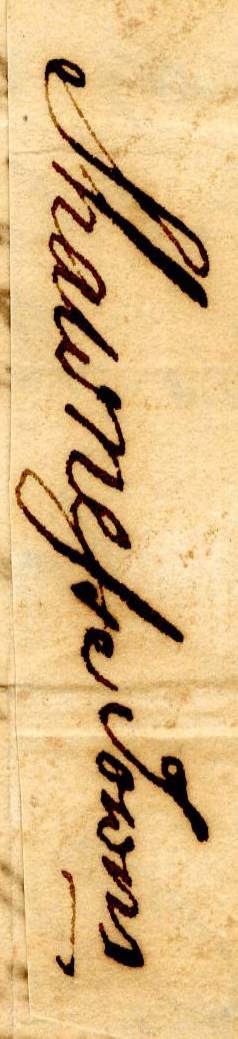Shawnesse Towns
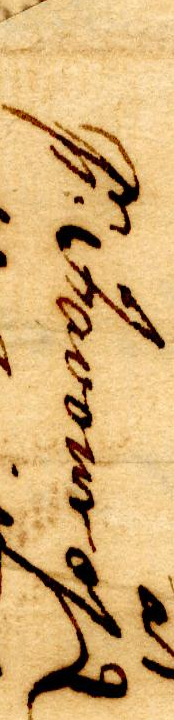p^r Favour of
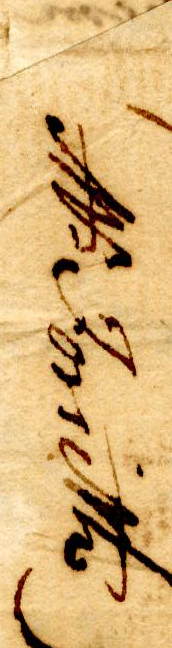M^r. Forsith
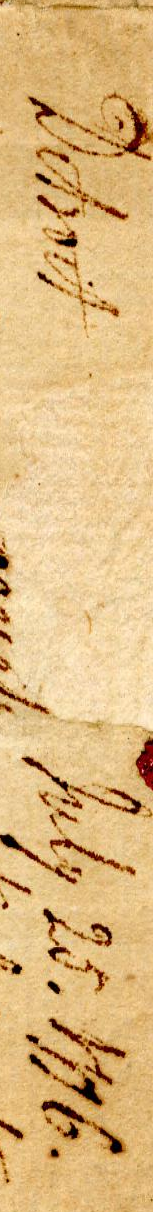Detroit July 25. 1776.
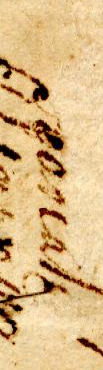ediah
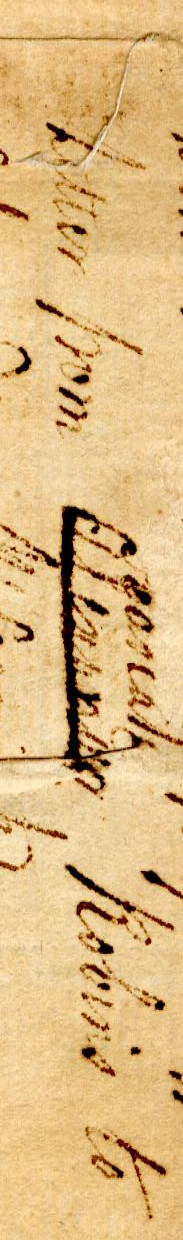Letter from Obenon Robins to
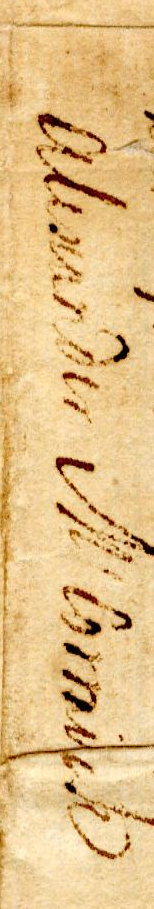Alexander McCormick
